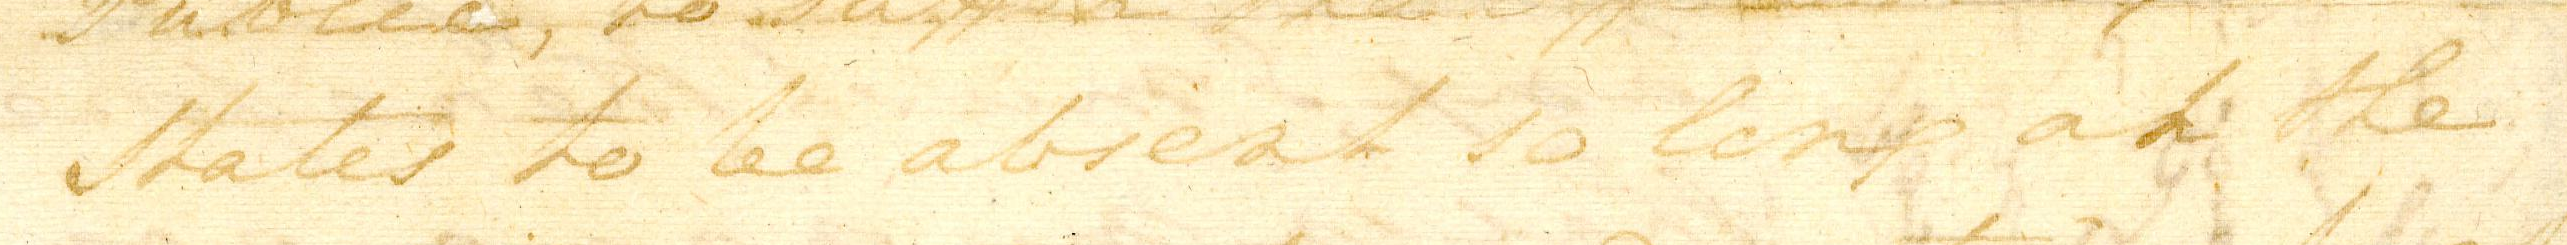States to be absent so long at the
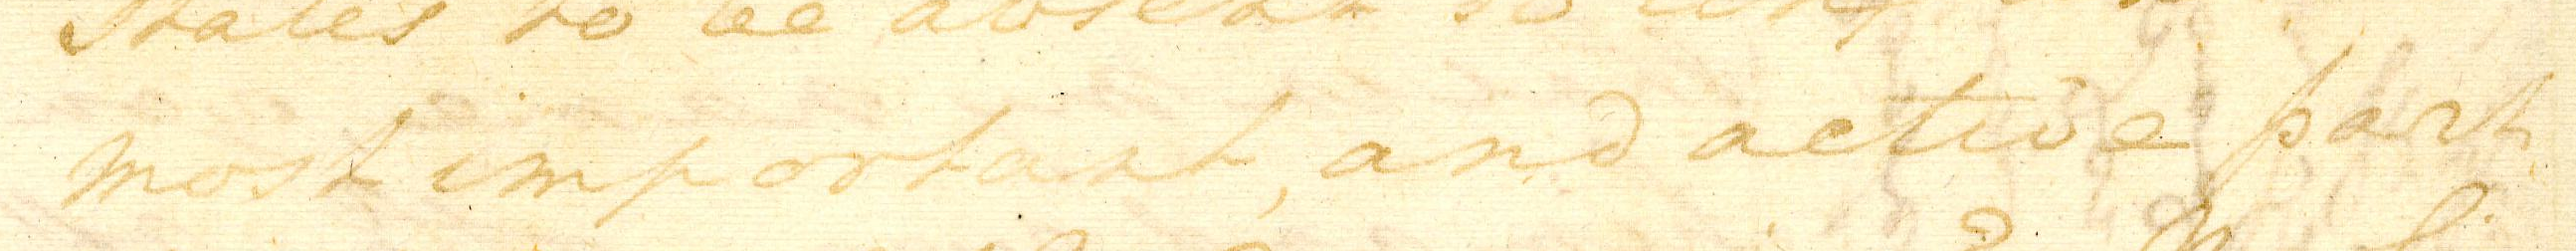most important and active part
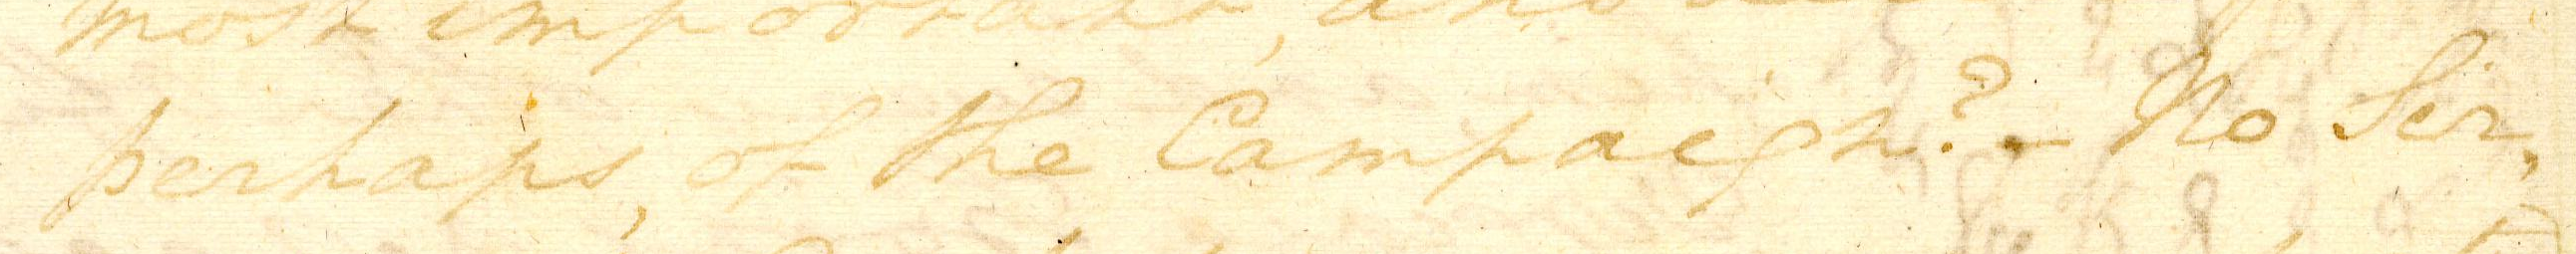perhaps, of the Campaign?- No Sir,
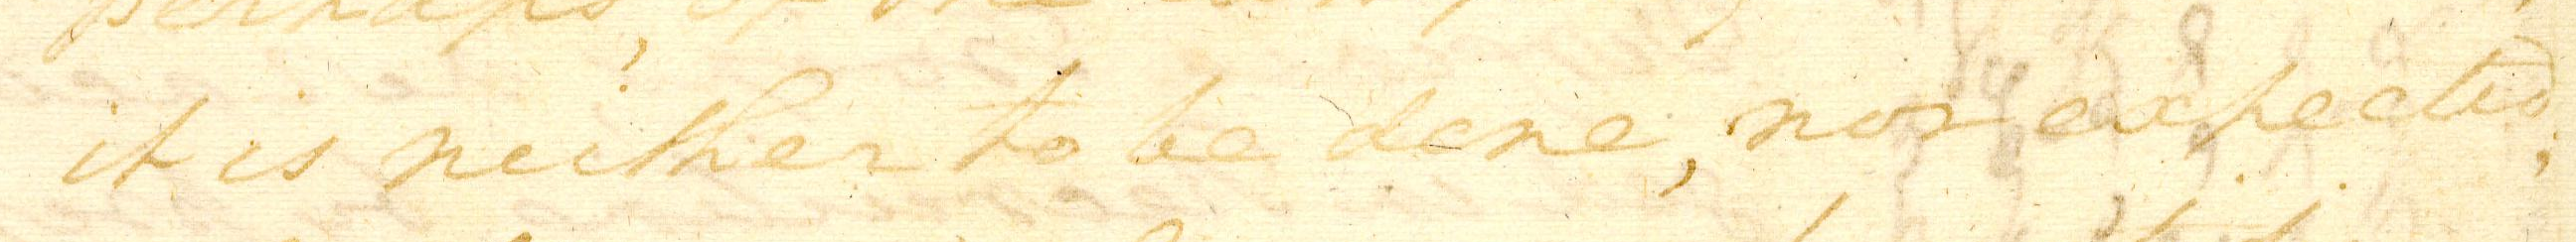it is neither to be done, nor expected.
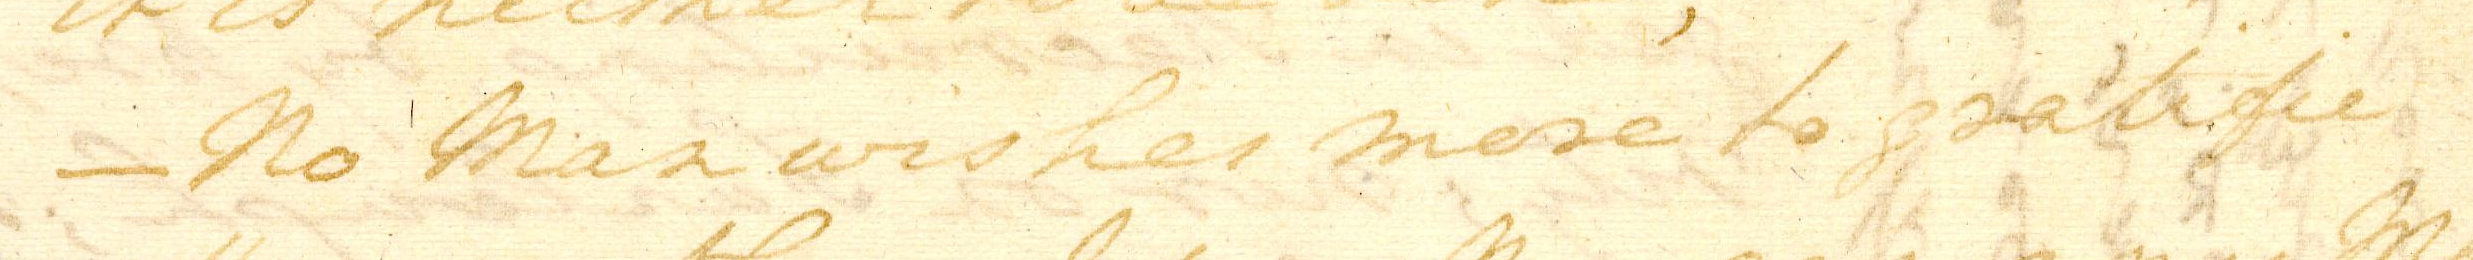-No Man wishes more to satisfie
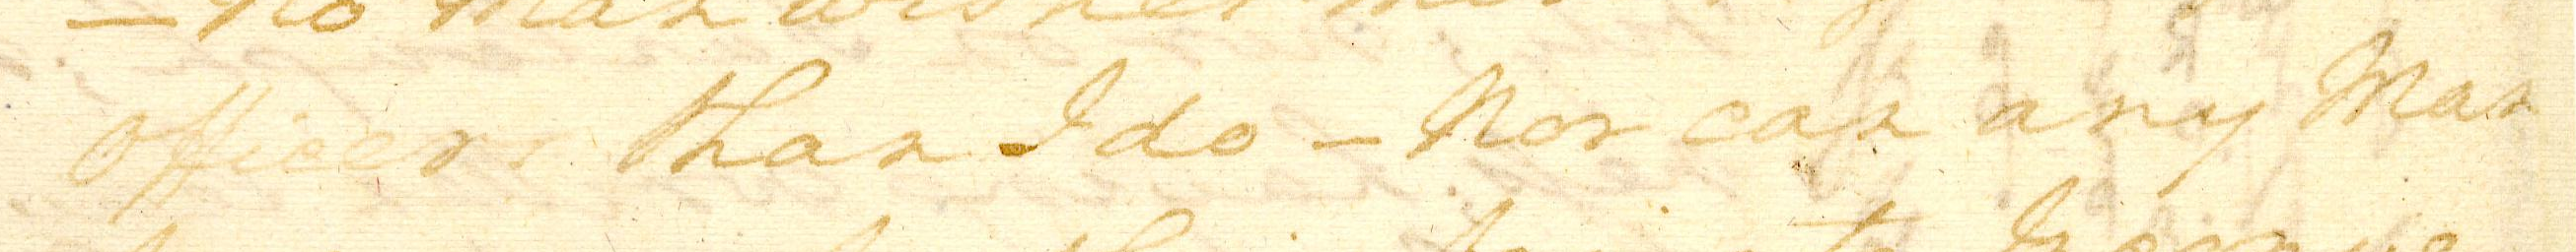Officers than I do- Nor can any Man
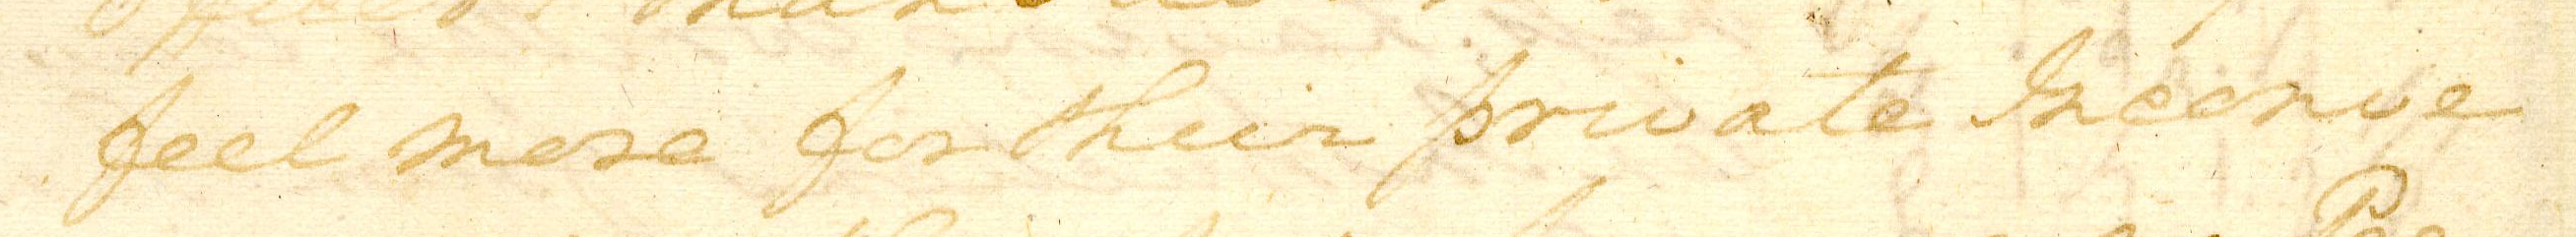feel more for their private Inconve
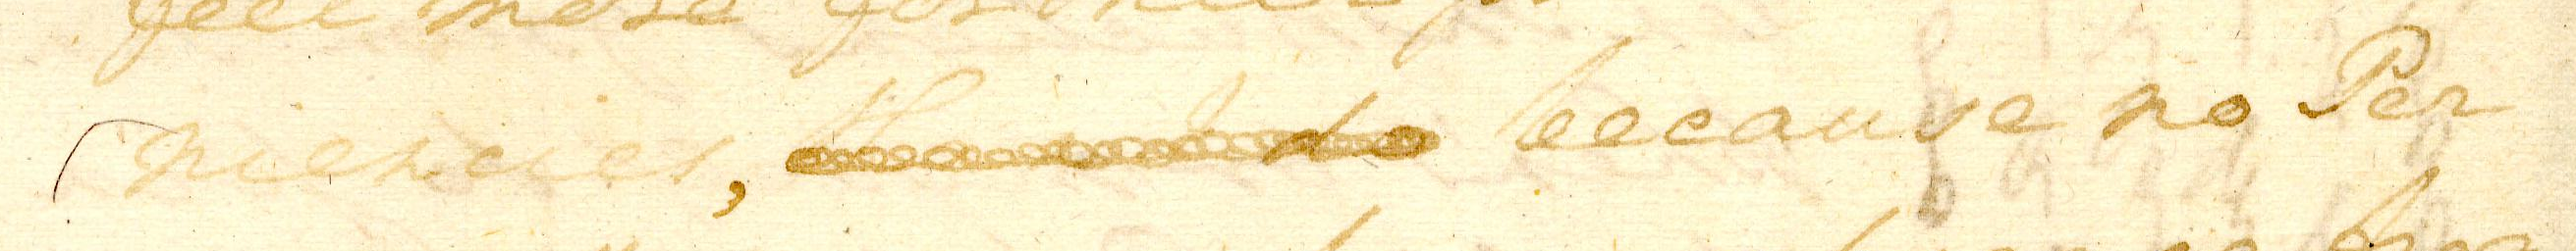niencies, [_______] because no Per
